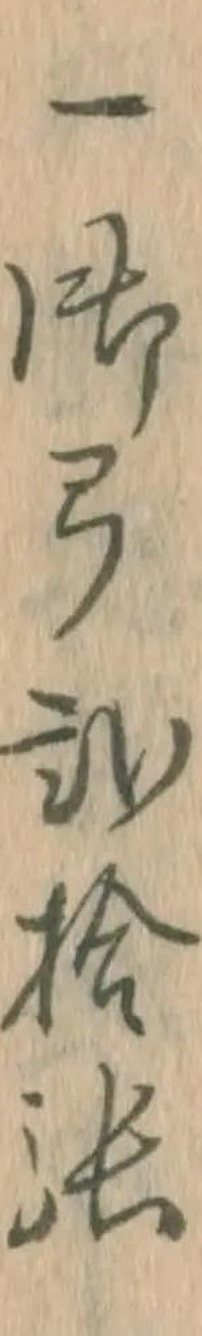一御弓弐拾張
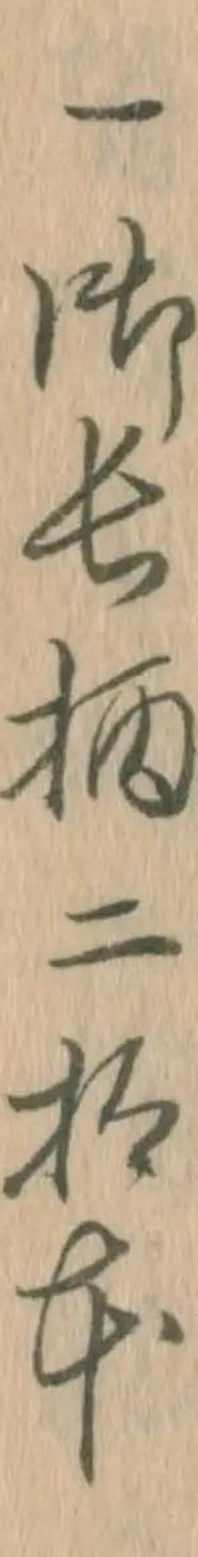一御長柄二拾本
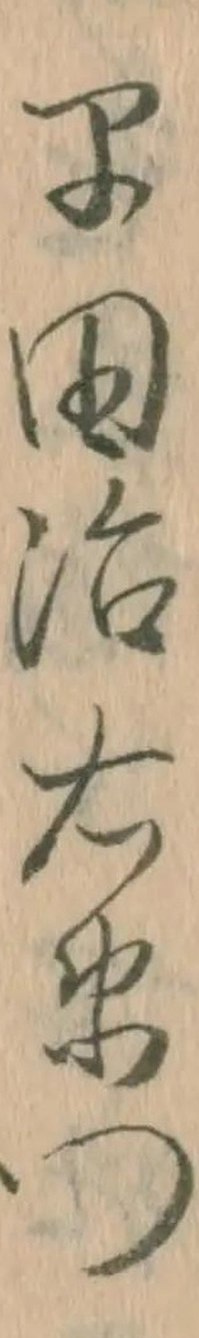早田治右衛門
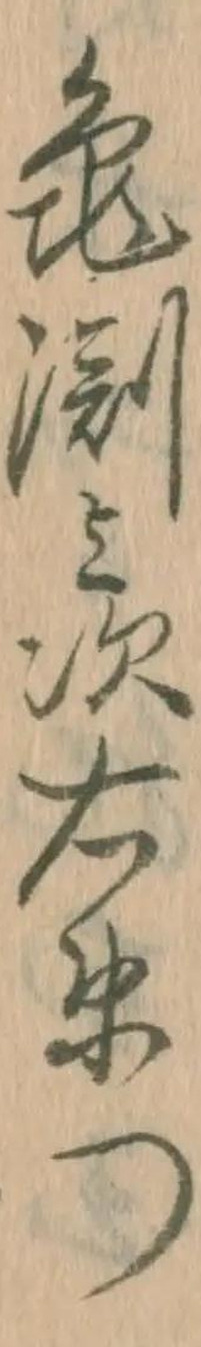亀渕与次右衛門
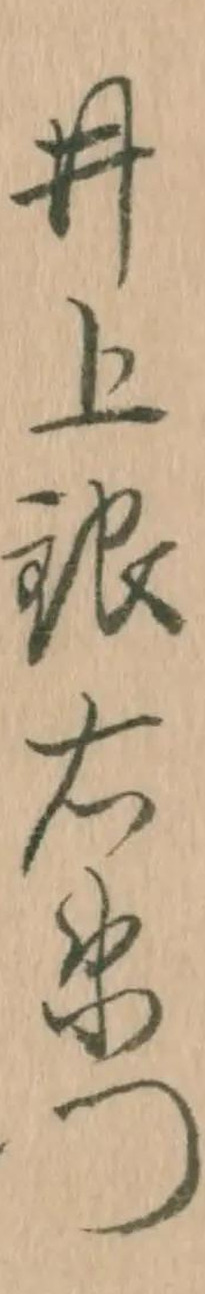井上銀右衛門
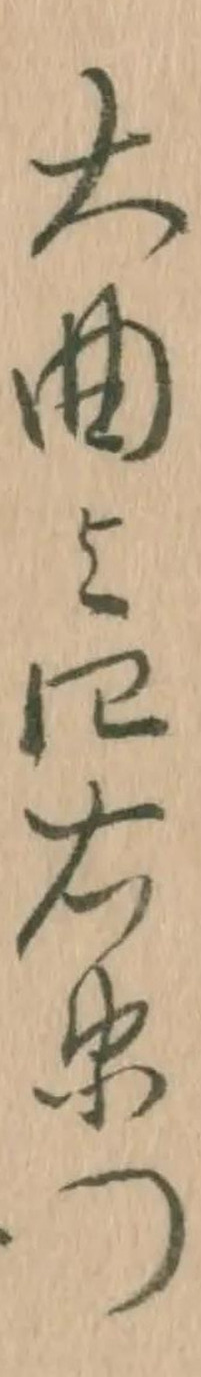大曲与四右衛門
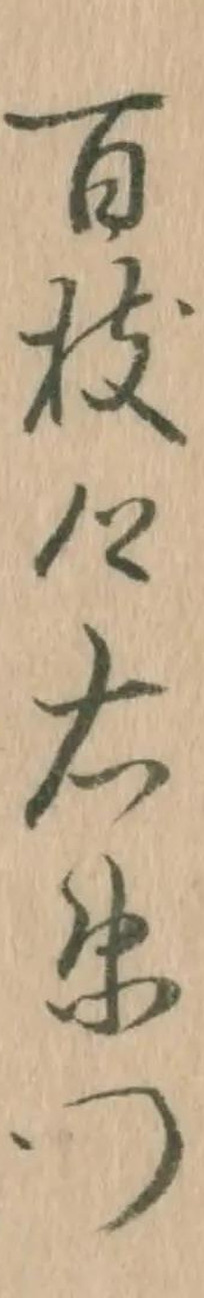百枝郷右衛門
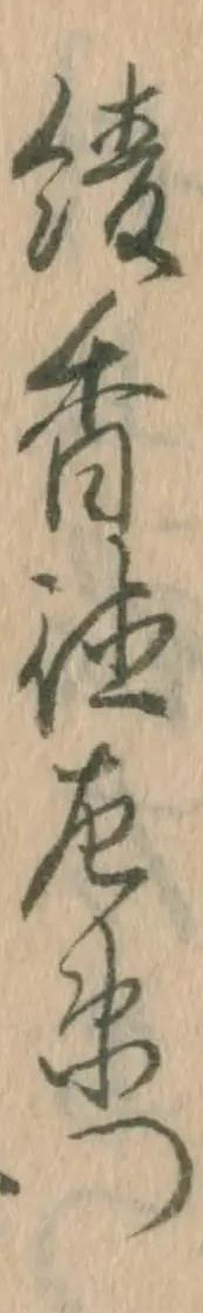綾香徳左衛門
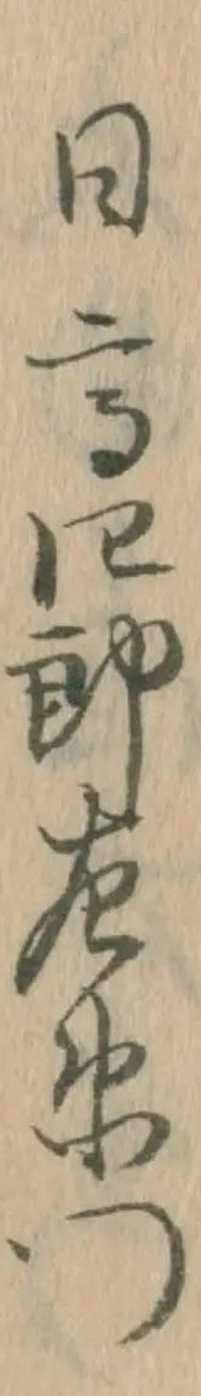日高四郎左衛門
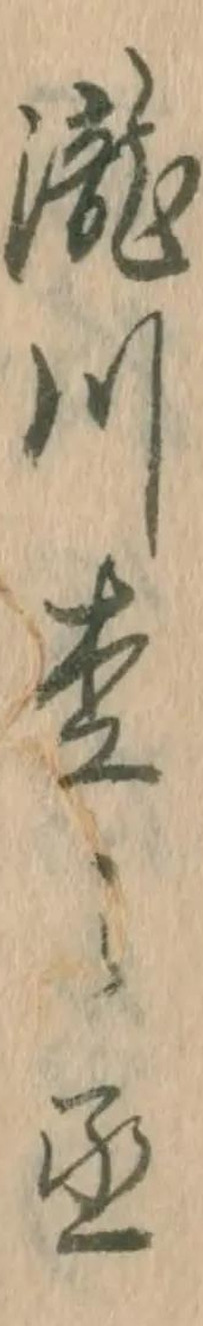瀧川杢之丞
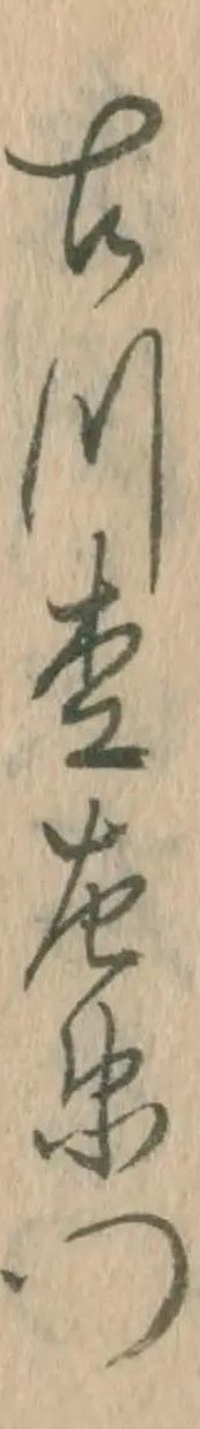古川杢左衛門
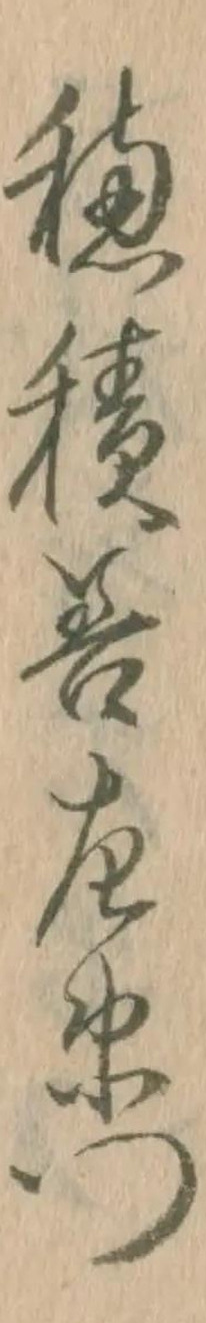穂積善左衛門
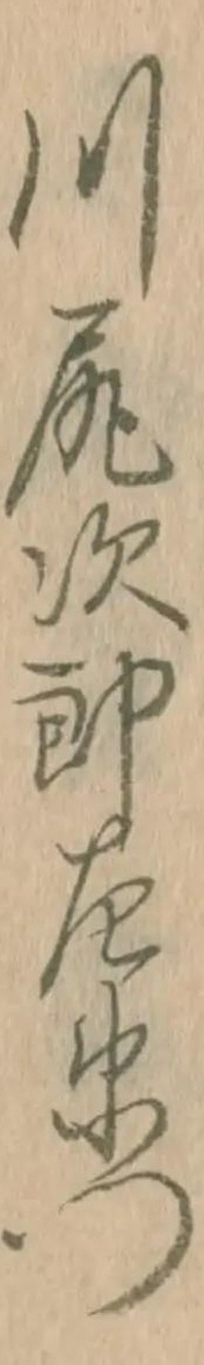川尻次郎左衛門
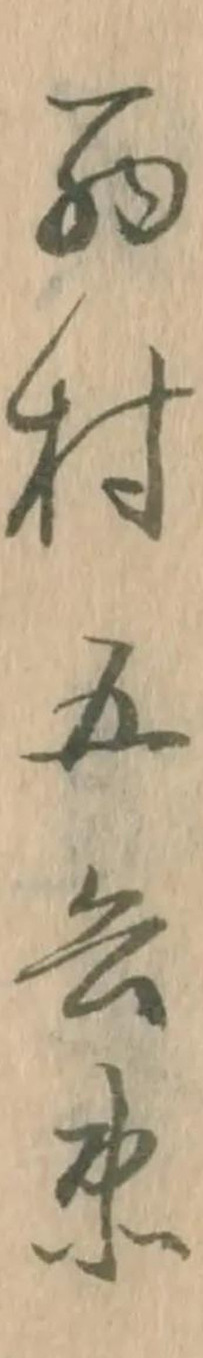西村五兵衛

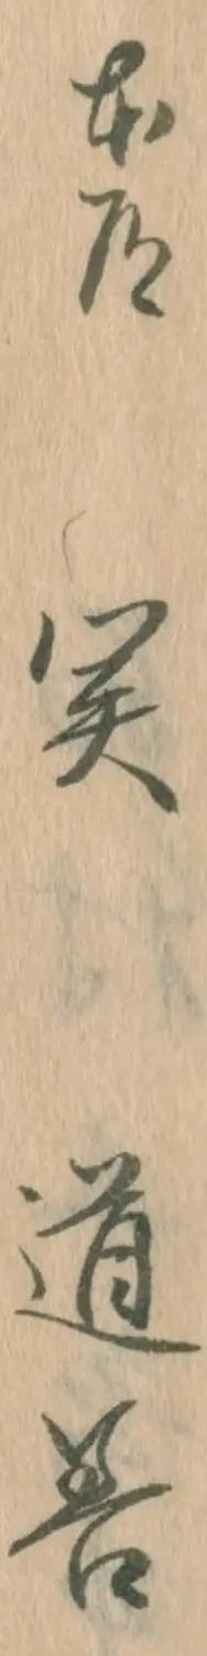本庄関道善
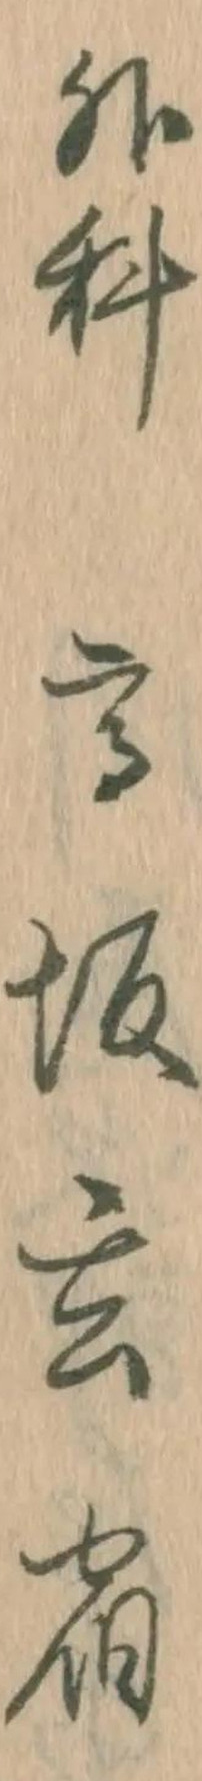外科高坂玄宿
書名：切支丹御退治記 49巻. [4]
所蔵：国立国会図書館 National Diet Library, JAPAN
